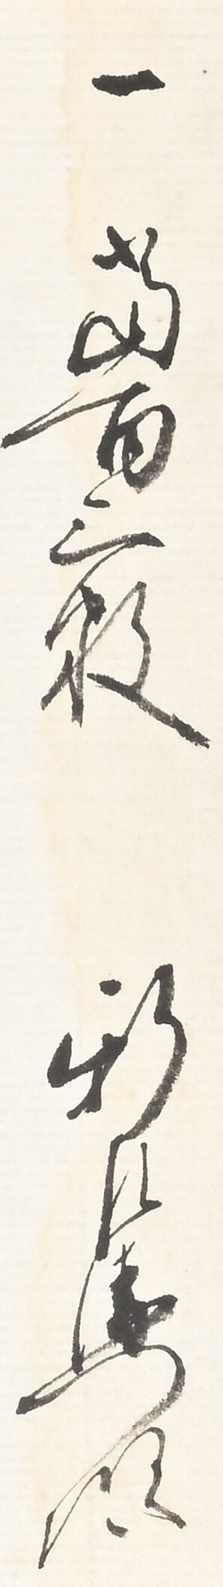一当百三枚新左衛門様
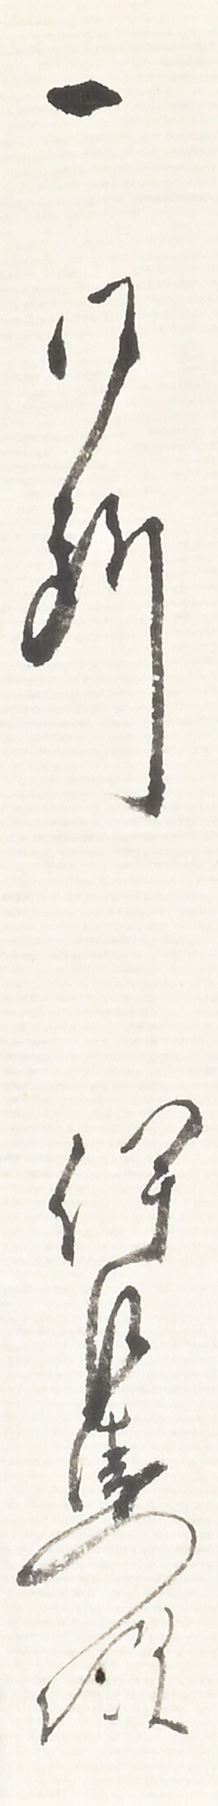一同断伊左衛門様
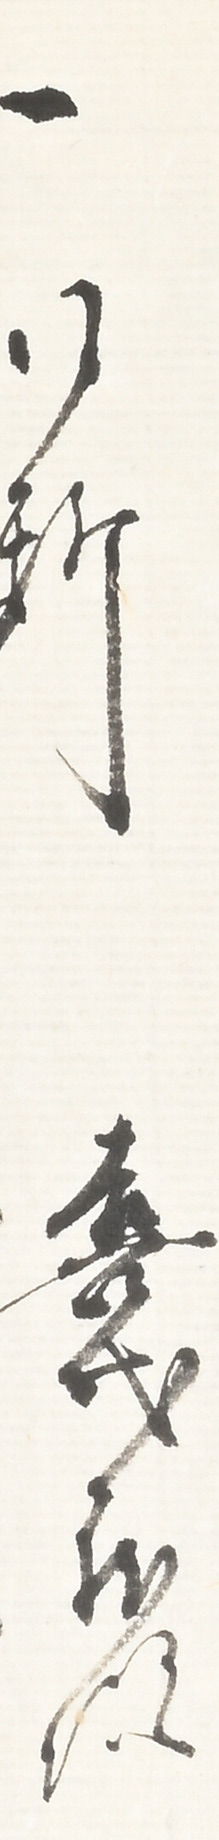一同断喜代蔵様
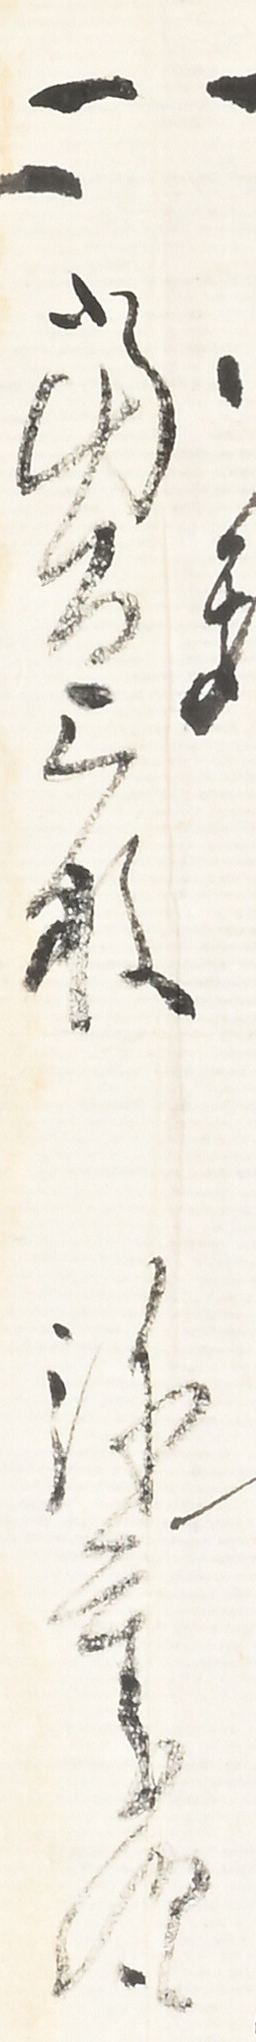一当百三枚弥二郎様
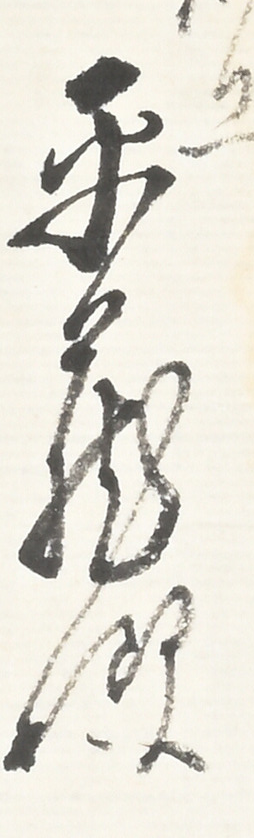平蔵様
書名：御祝儀目録
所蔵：伊那市立高遠町図書館・合同会社AMANE
